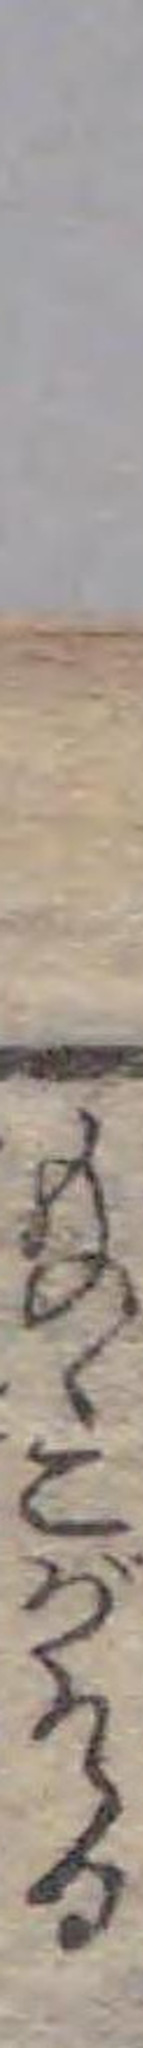ものゝこがかゝる
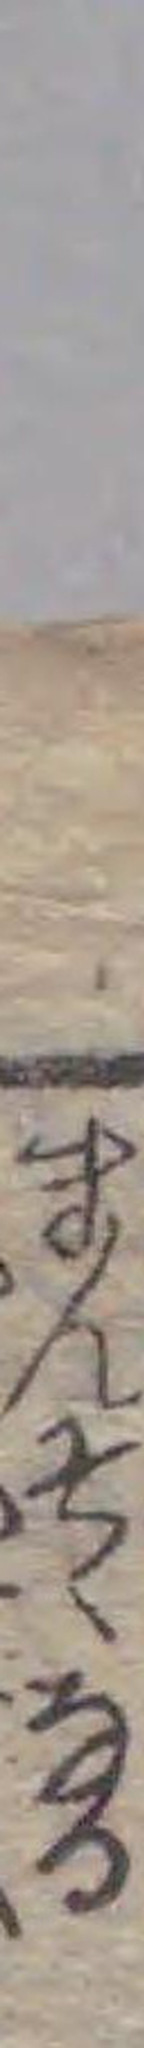まんそくなる
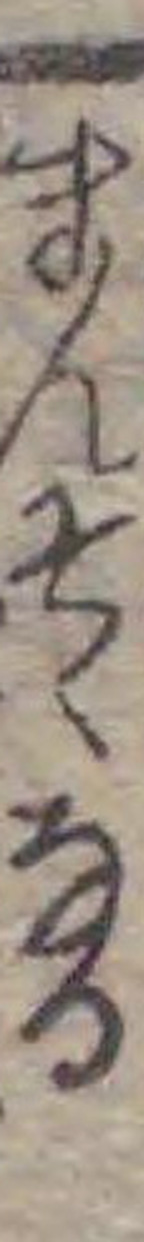まんそくなる
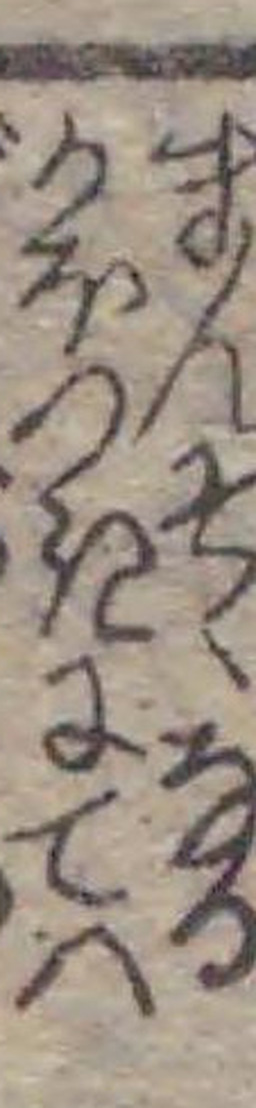かほつきにては
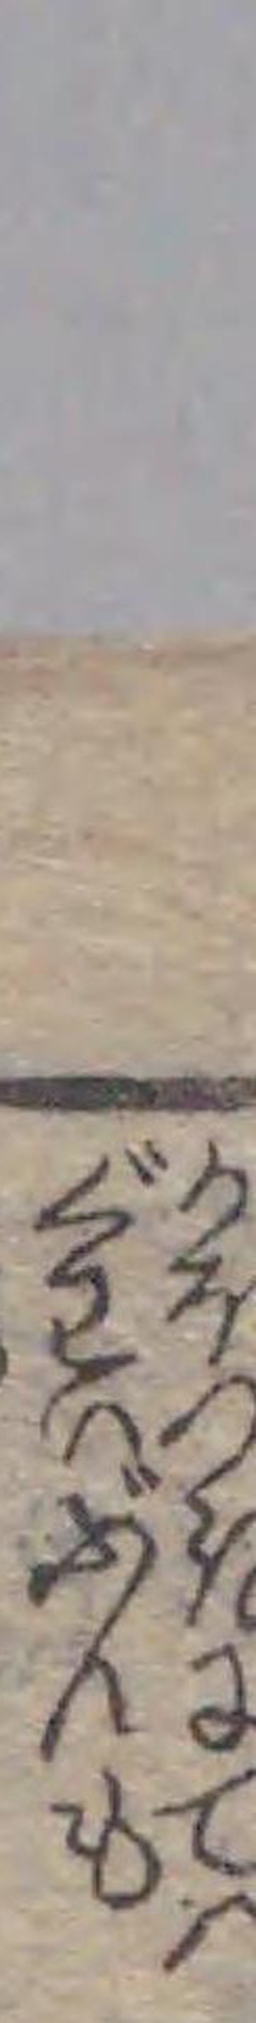ぐわいぶんも
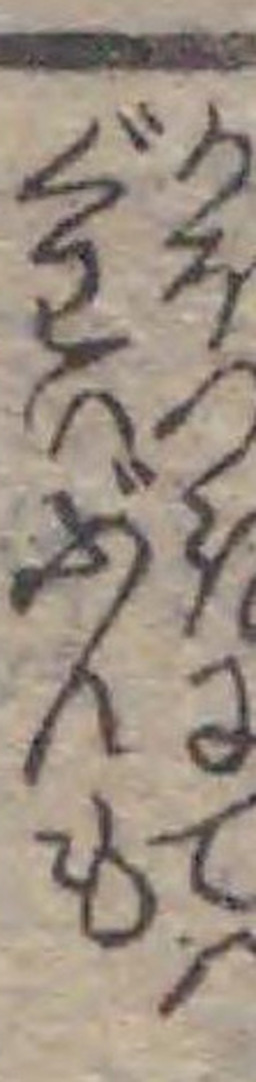ぐわいぶんも
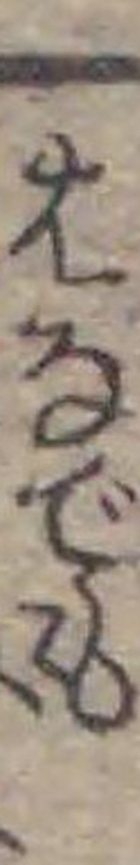はなでも
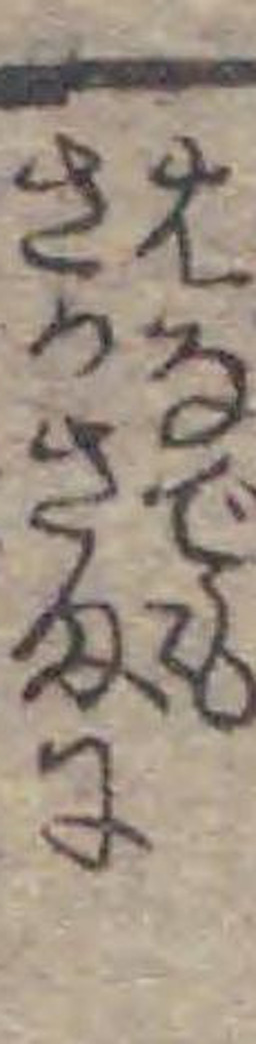さかさまに
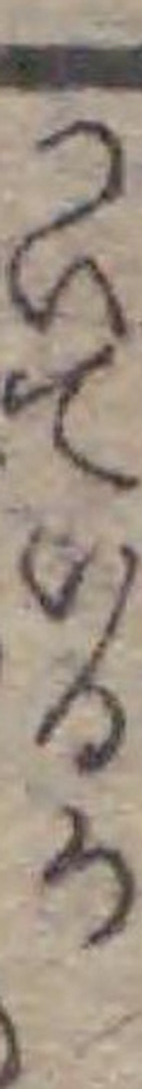ついているか
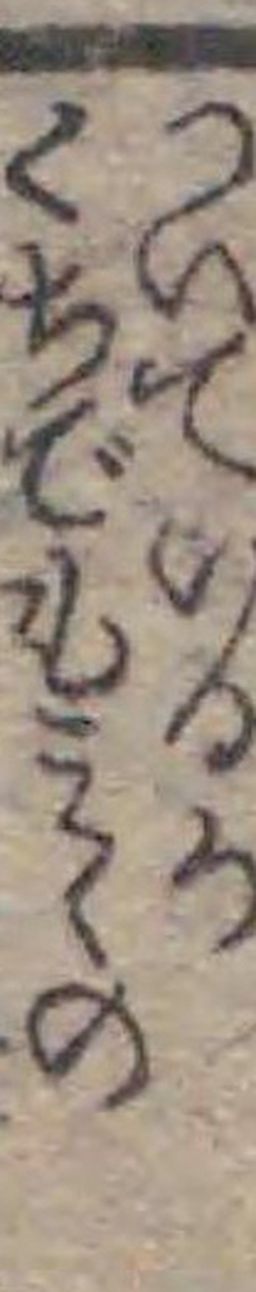くちでもみゝの
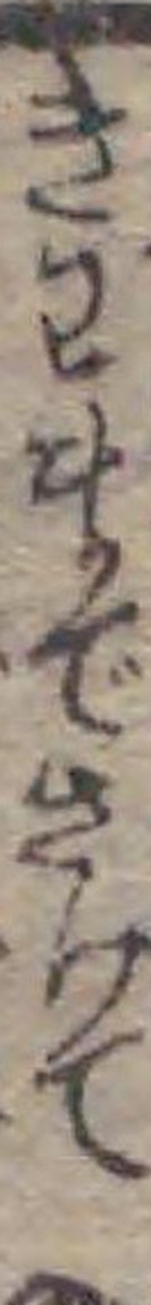きわまでさけて
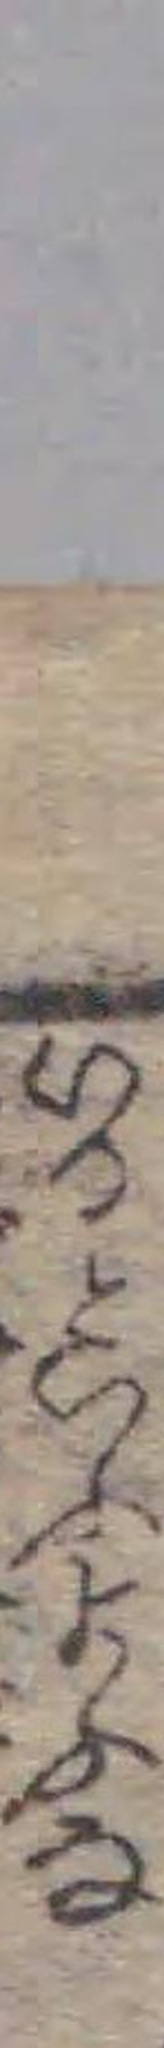いるといふよふな
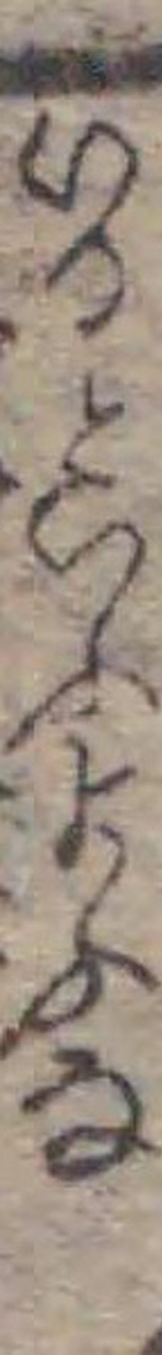いるといふよふな
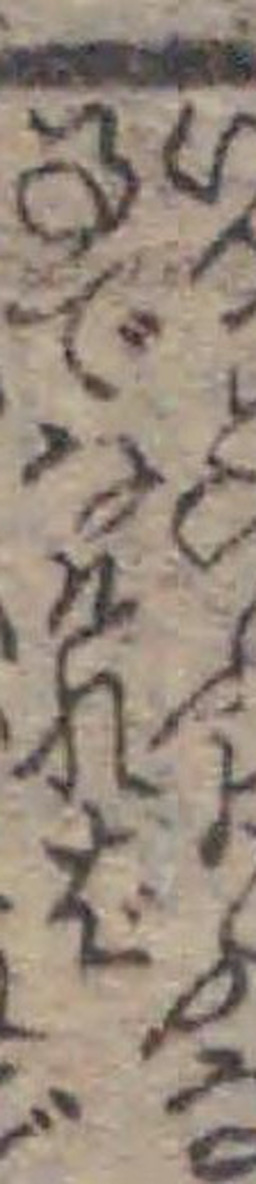事でなければ
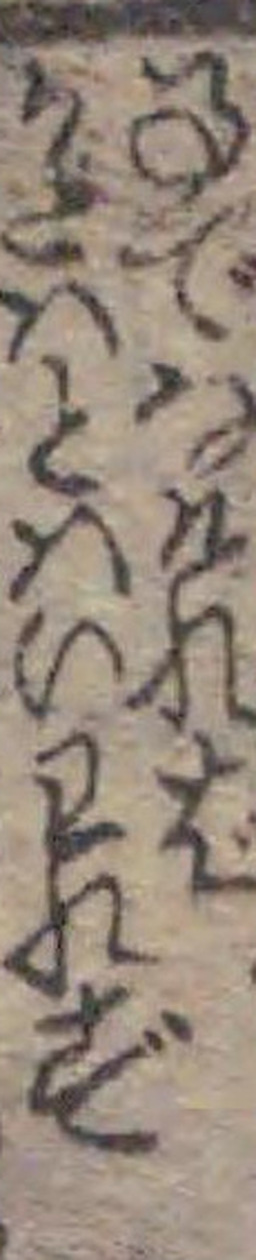かたはとはいわれず
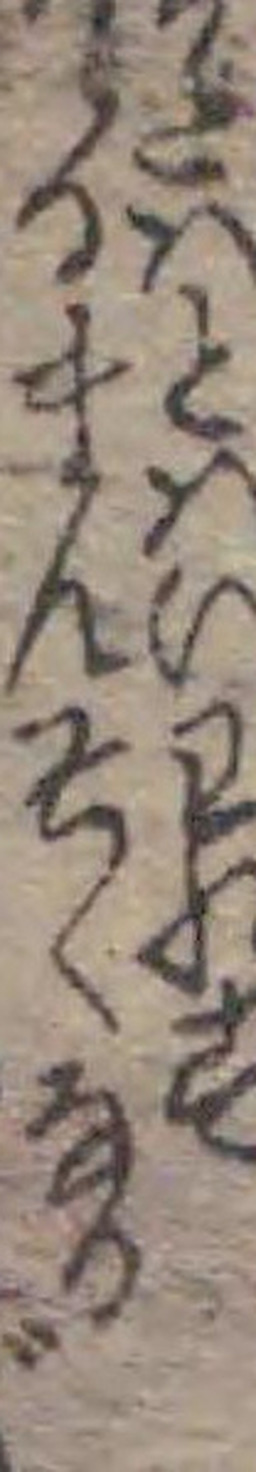まんそくなる
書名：化物見越松 : 2巻
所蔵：国立国会図書館 National Diet Library, JAPAN
